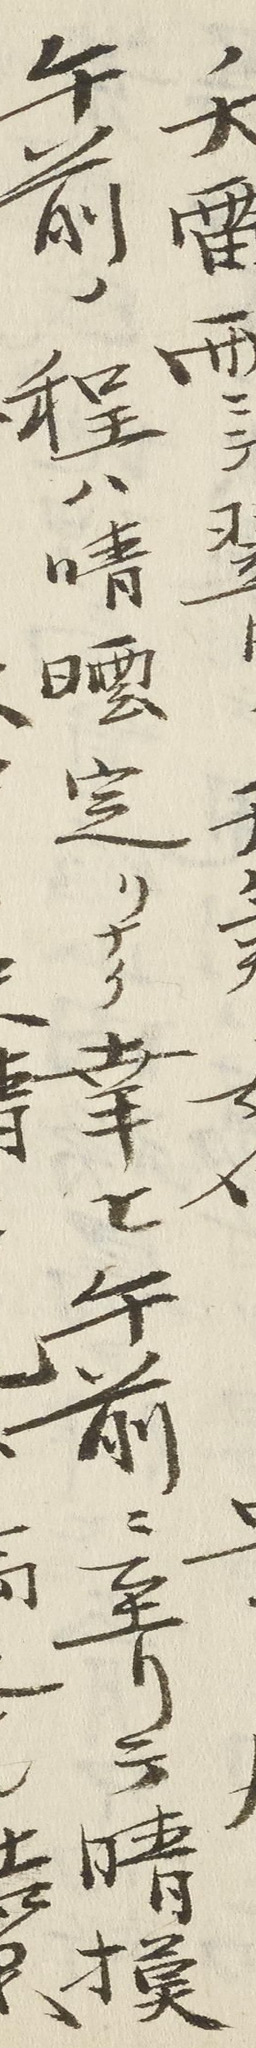午前ノ程ハ晴曇定リナク幸ヒ午前二至リテ晴模
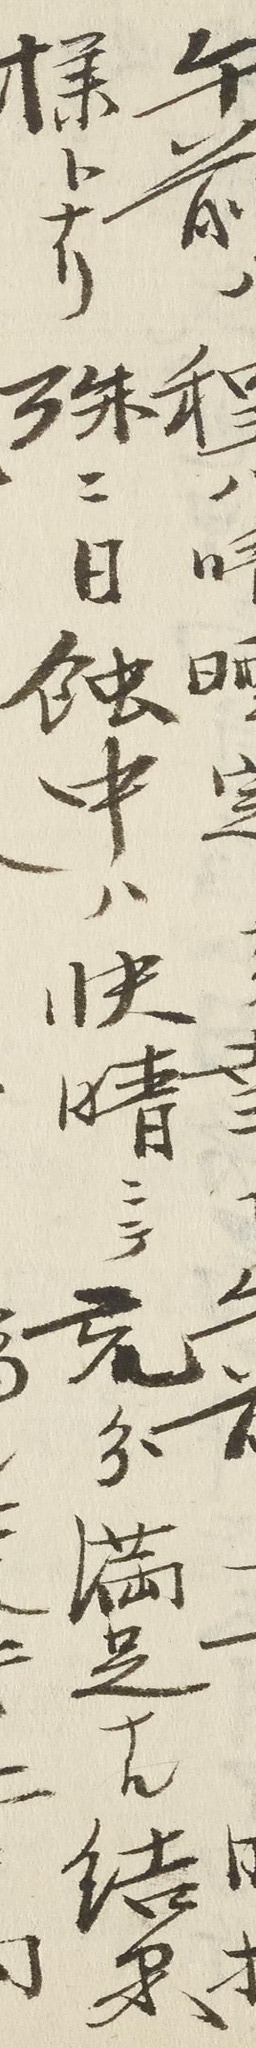様トナリ殊二日蝕中ハ快晴ニテ充分満足ナル結果
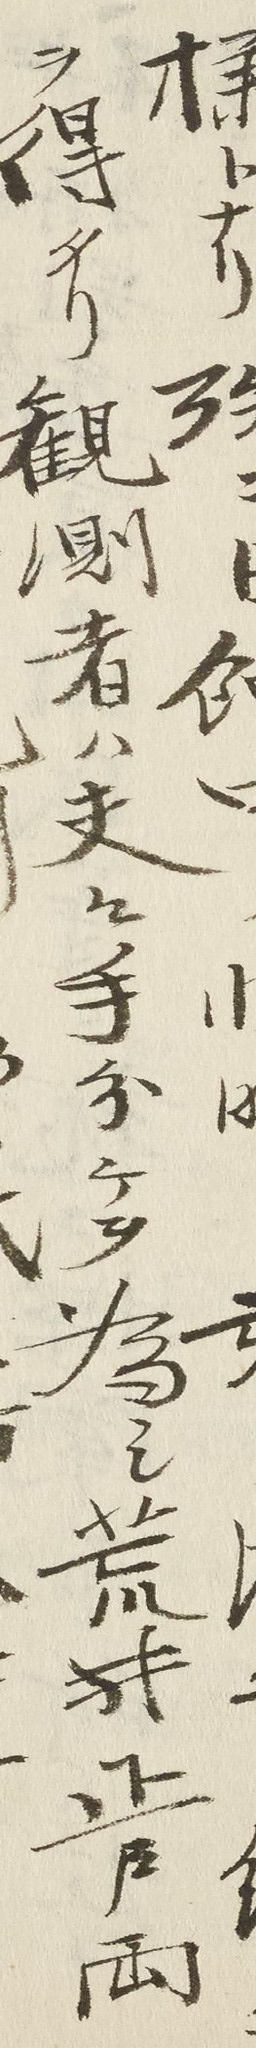ヲ得タリ観測者ハ夫々手分ケヲ為シ荒井正戸両
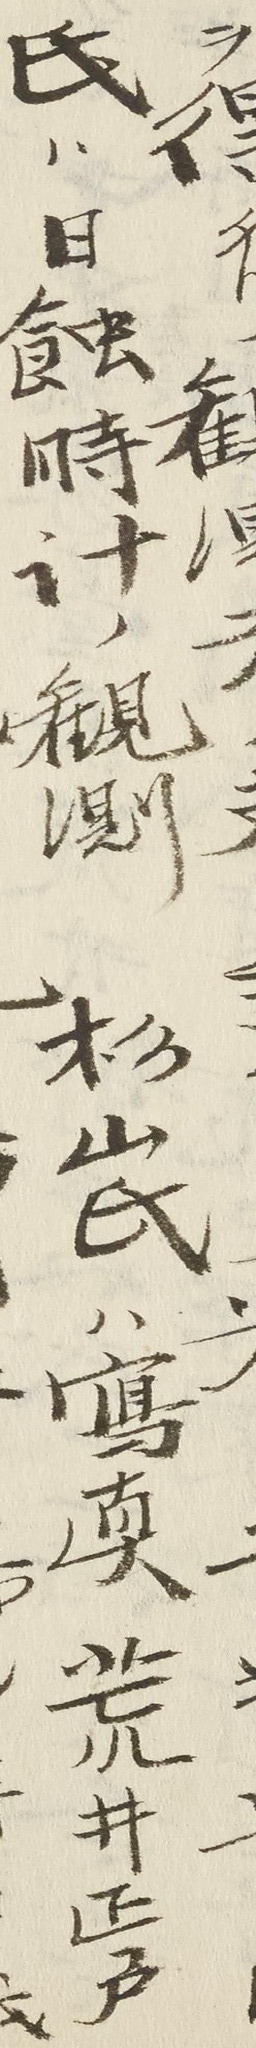氏ハ日蝕時計ノ観測杉山氏ハ写真荒井正戸
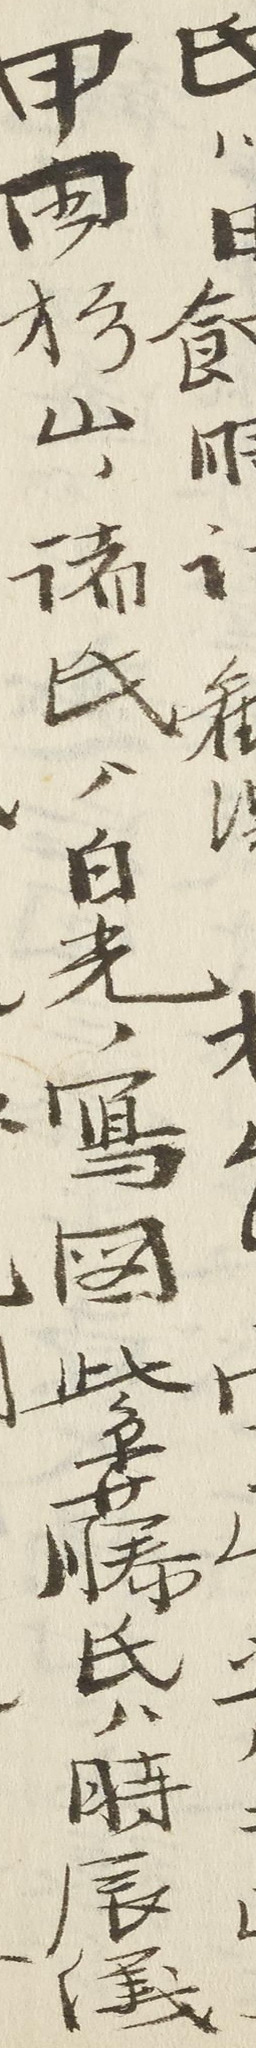甲田杉山ノ諸氏ハ白光ノ写図紫藤氏ハ時辰儀
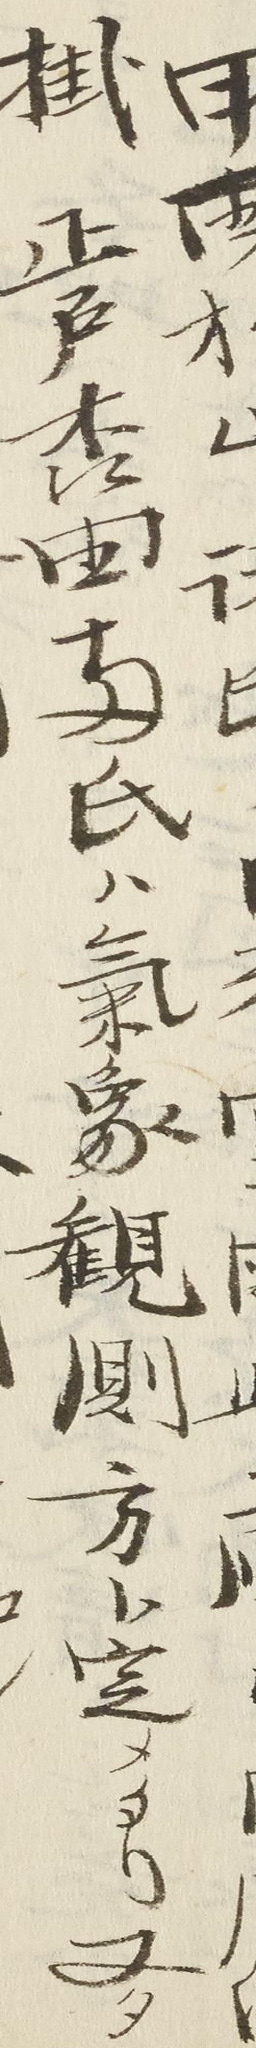掛正戸杏田両氏ハ気象観測方ト定メタリ又タ
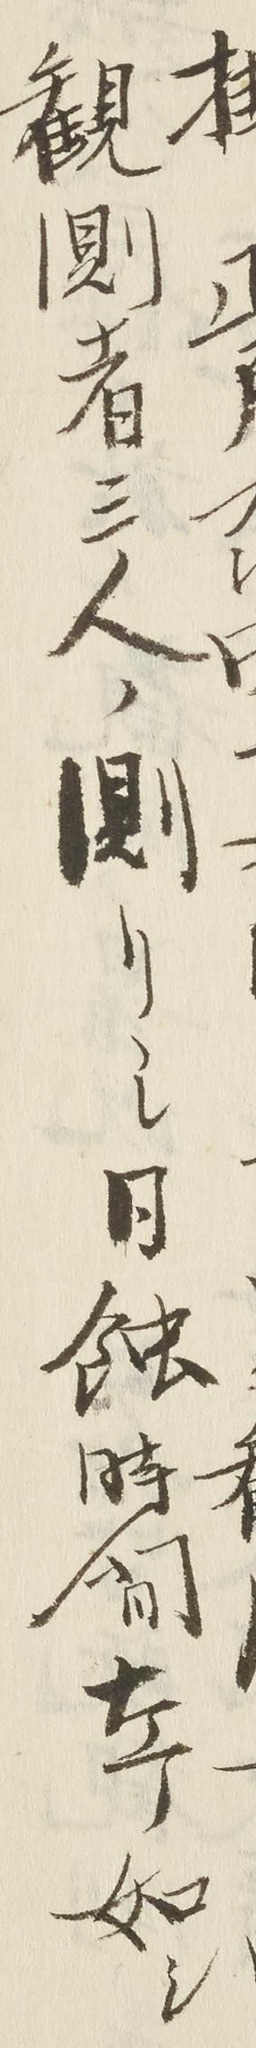観測者三人ノ測リシ日蝕時間左ノ如シ
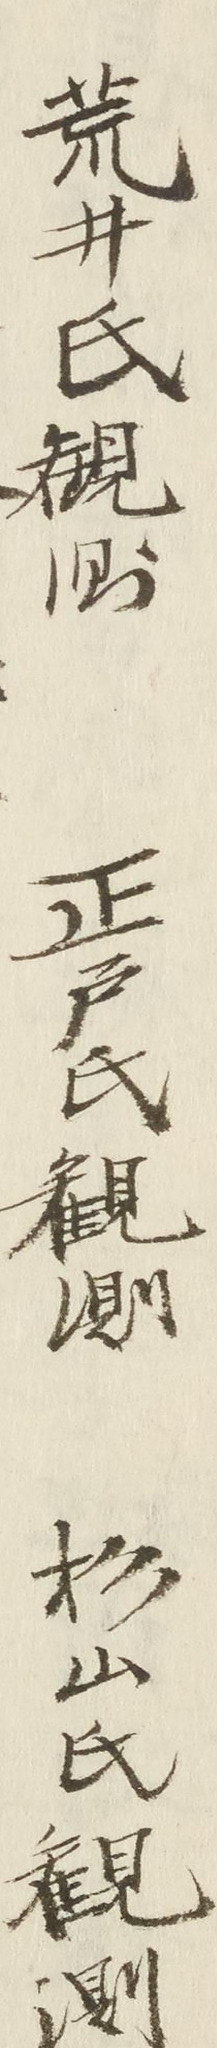荒井氏観測正戸氏観測杉山氏観測
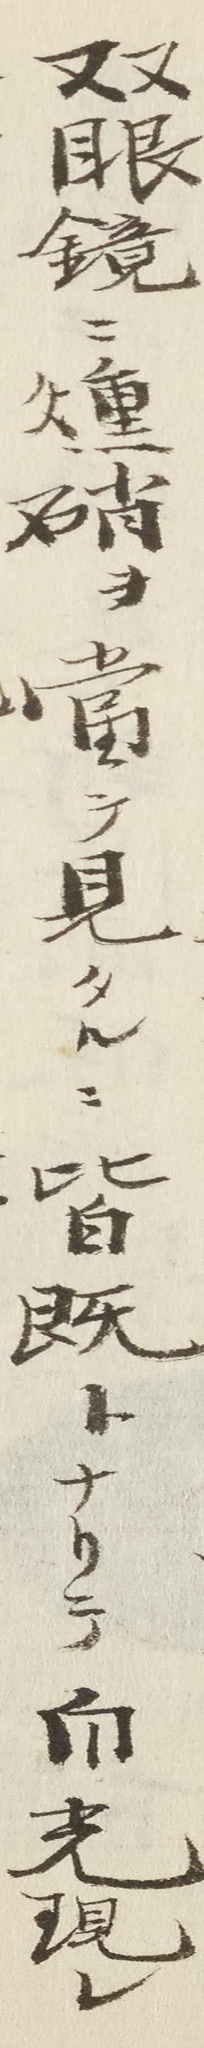双眼鏡二燻硝ヲ当テ見タル二皆既トナリテ白光現レ
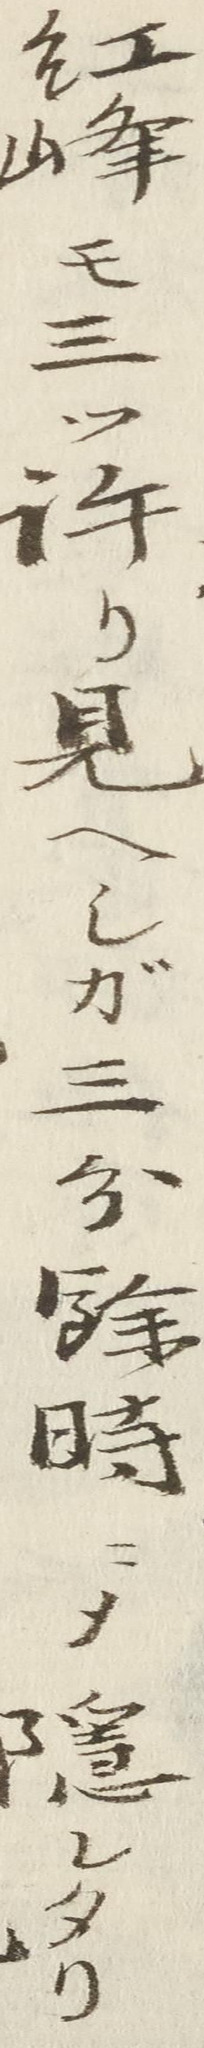紅峰モ三ツ許リ見ヘシガ三分余時二シテ隠レタリ
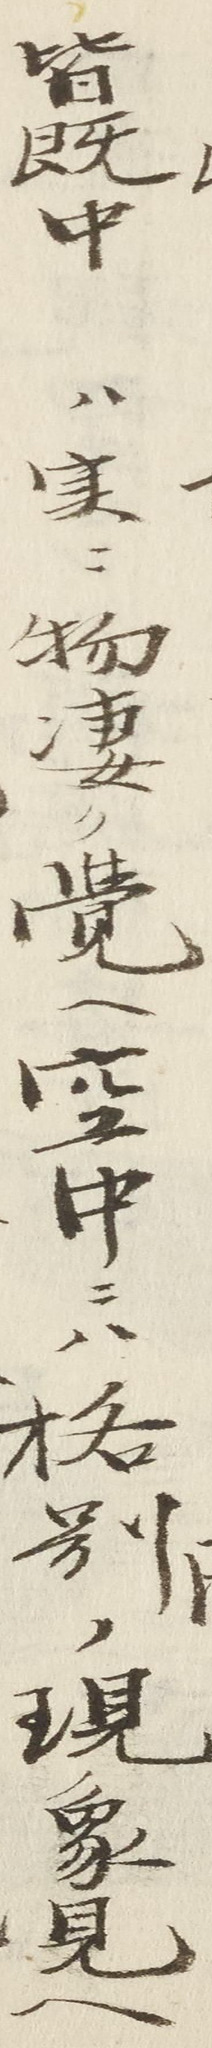皆既中ハ実二物凄ク覚ヘ空中ニハ格別ノ現象見ヘ
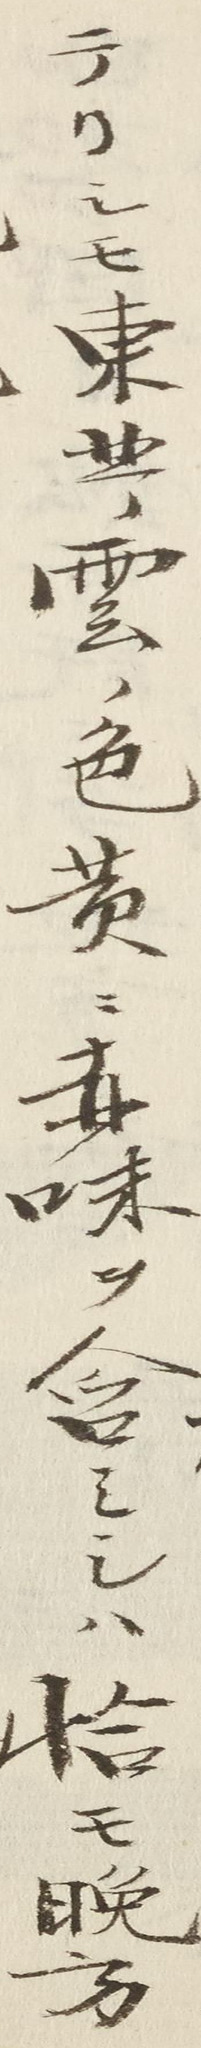テリシモ東北ノ雲ノ色黄二赤味ヲ含ミシハ恰モ晩方
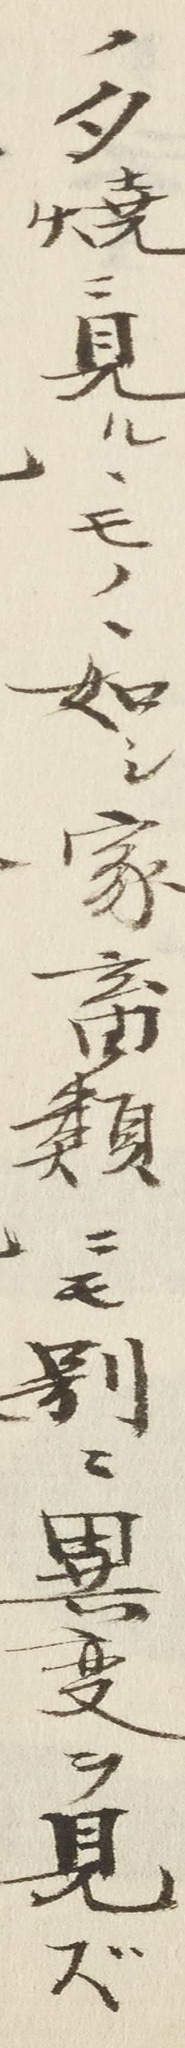ノ夕焼二見ルゝモノゝ如シ家畜類二モ別二異変ヲ見ズ
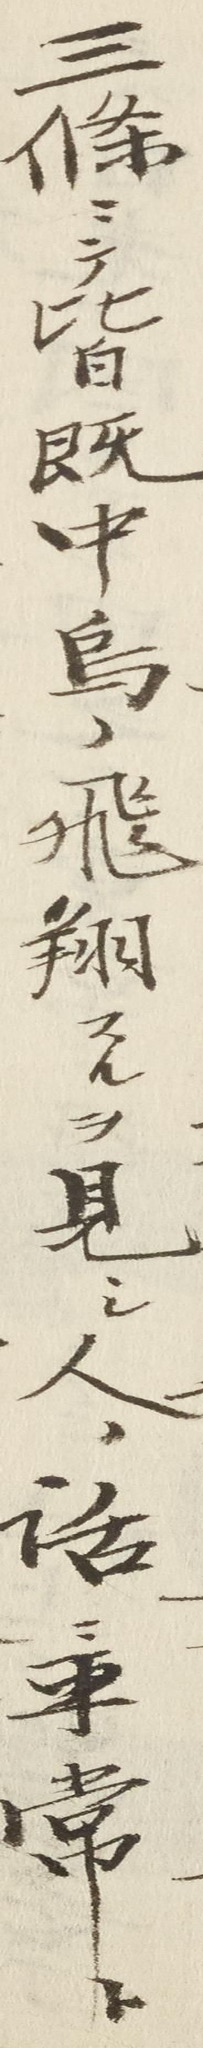三條ニテ皆既中鳥ノ飛翔スルヲ見シ人ノ話二平常ト
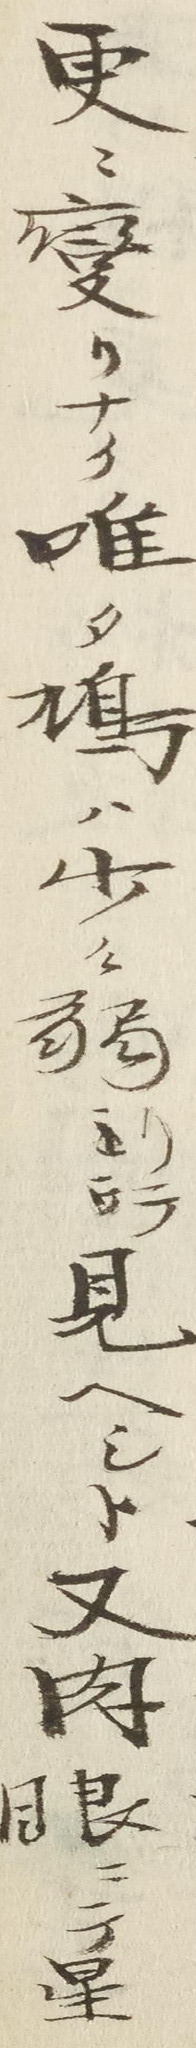更二変リナク唯タ鳩ハ少々弱リテ見ヘシト又肉眼ニテ星

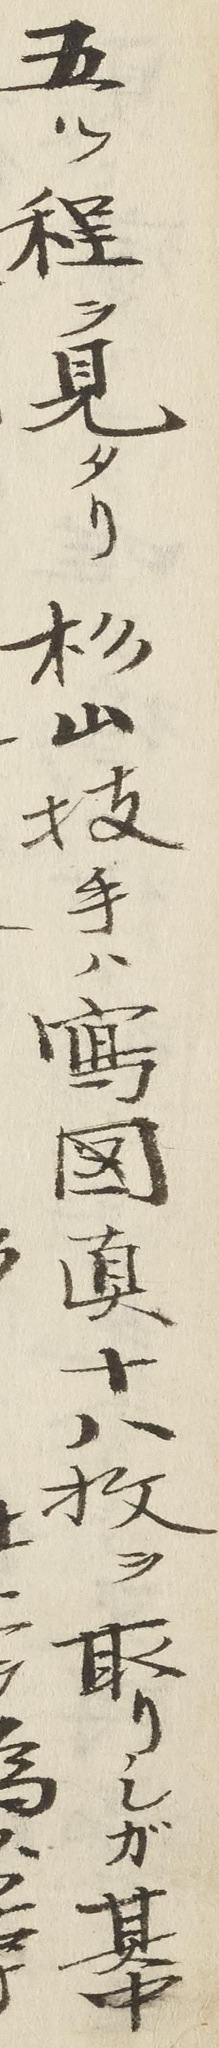五ツ程見タリ杉山技手ハ写図真十八枚ヲ取リシガ其中
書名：日蝕録　全
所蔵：東京大学地震研究所図書室 Earthquake Research Institute Library, The University of Tokyo, JAPAN
